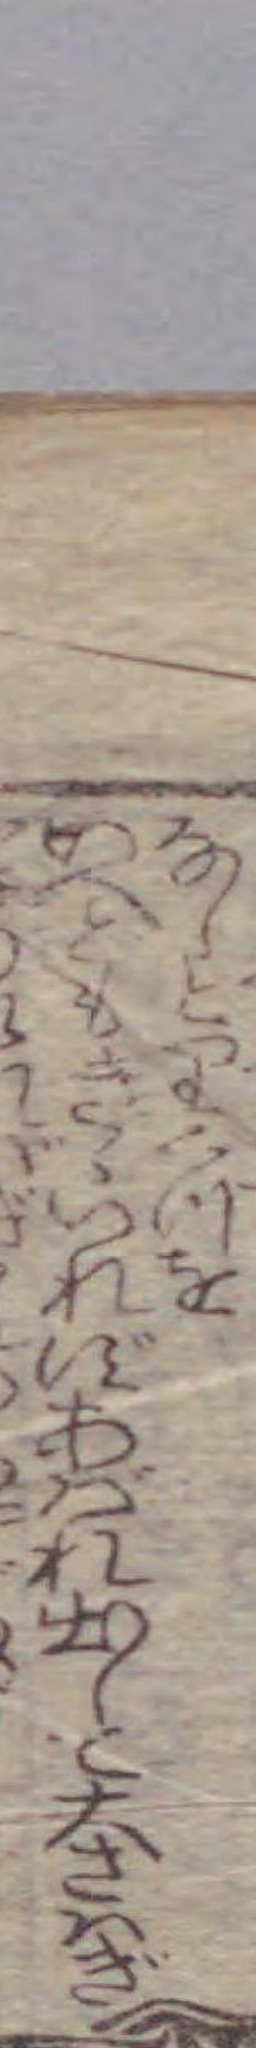いへともきゝいれずあばれ出して大さはぎ
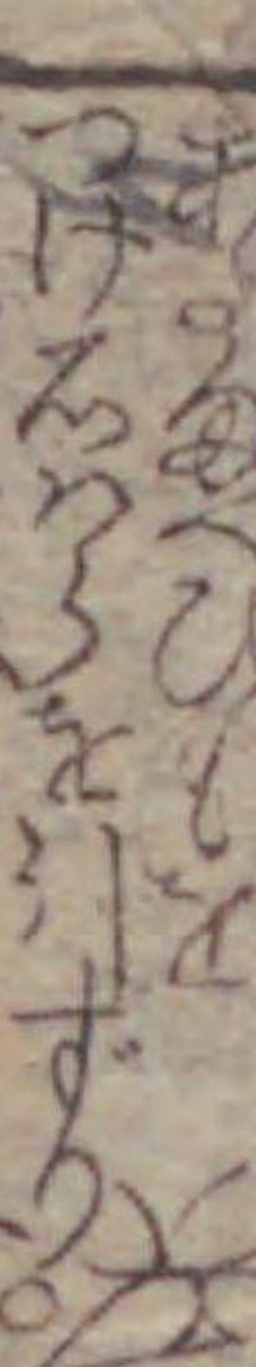つけ石はらを引きずり
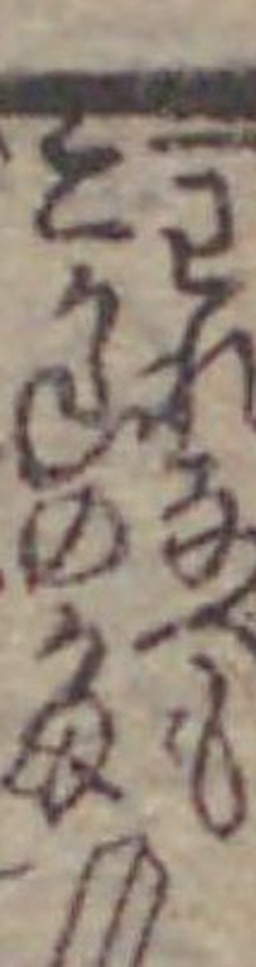こかねのかま
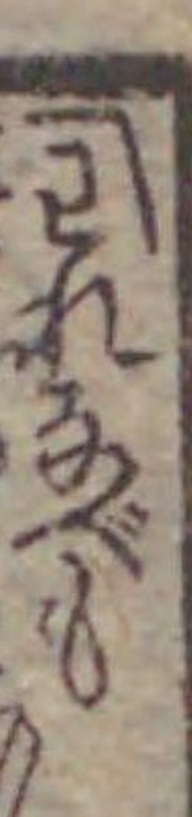〽われなべも
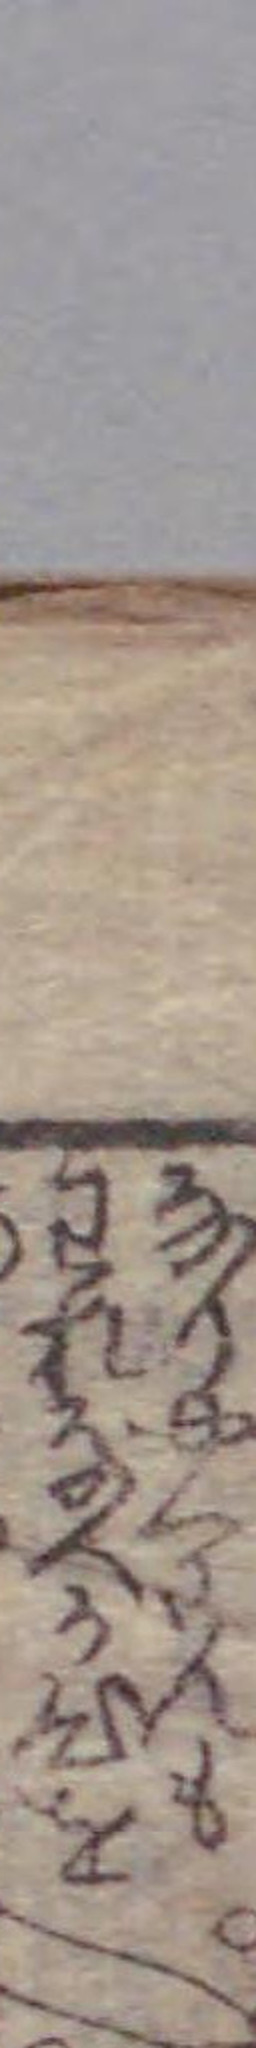われなへか心を
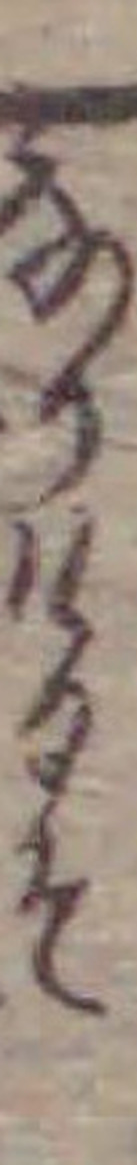なりけるそ
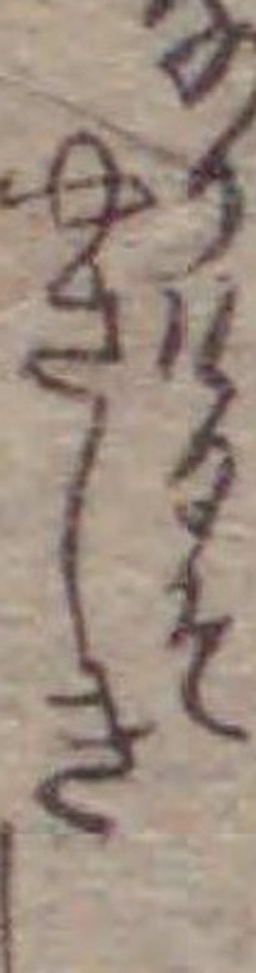やさしき

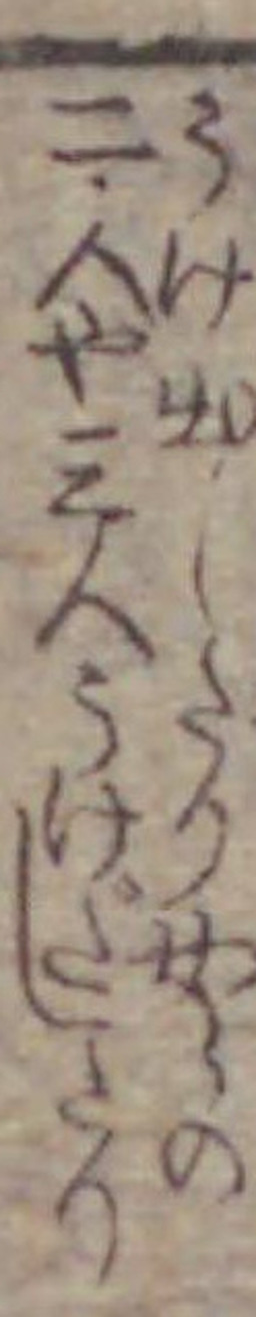二人や三人うけだしたり
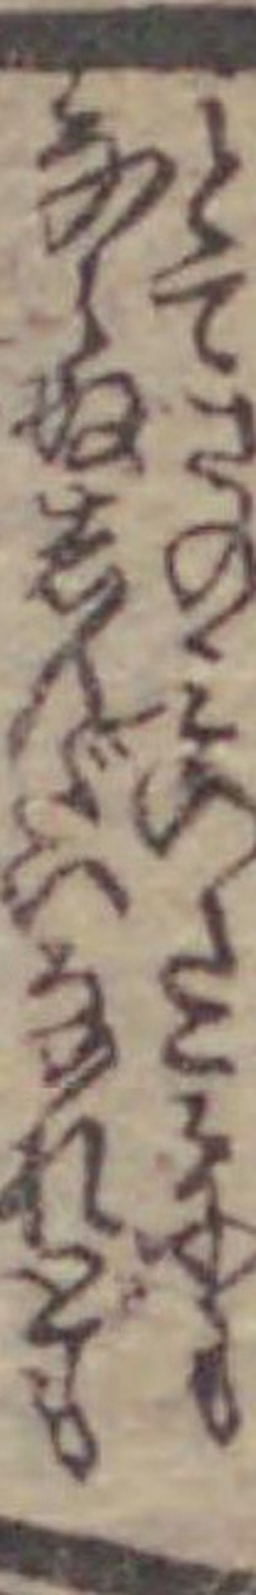ならぬしんだいなれとも
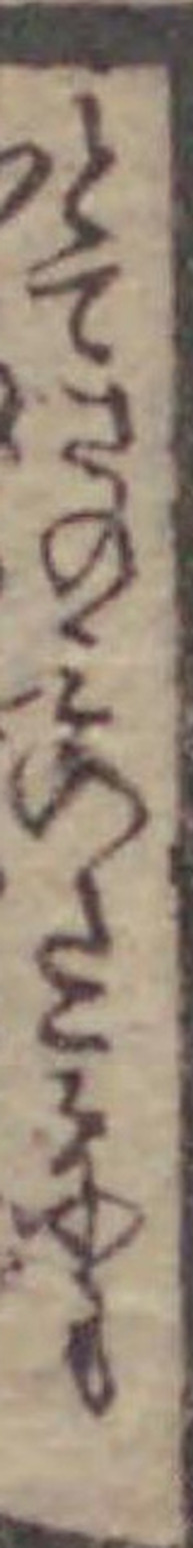とてさのみいたみにも
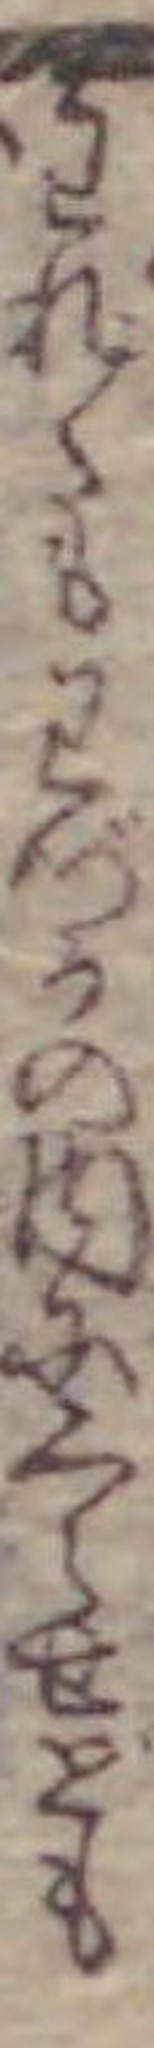われ〳〵もわづかの内にくらせども
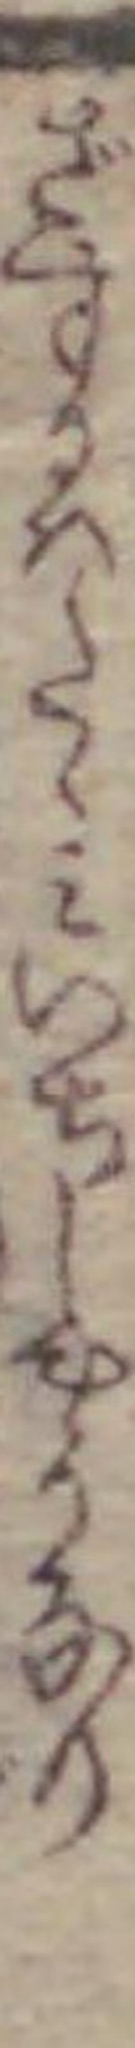ざするたゝみいちしやうなり
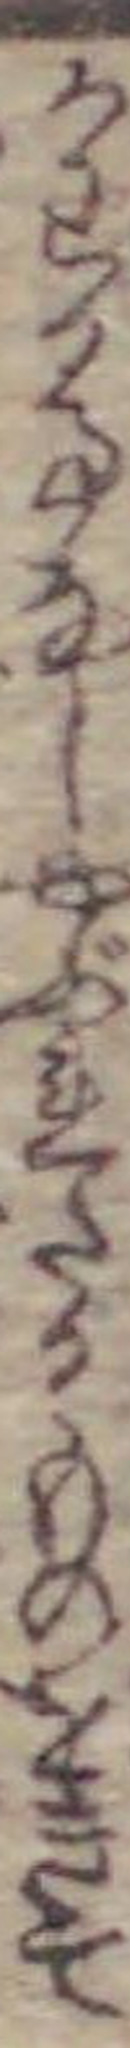かわる事なしやぶれたるものをきて
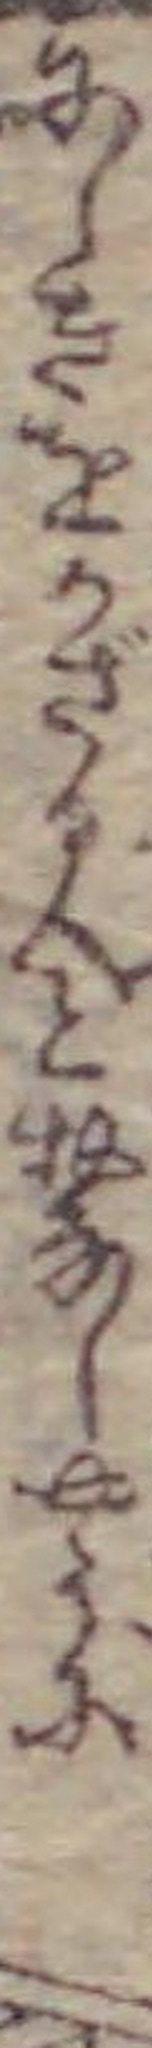にしきをかざる人とおなしやふに
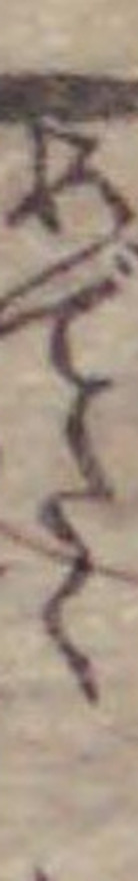めでたく
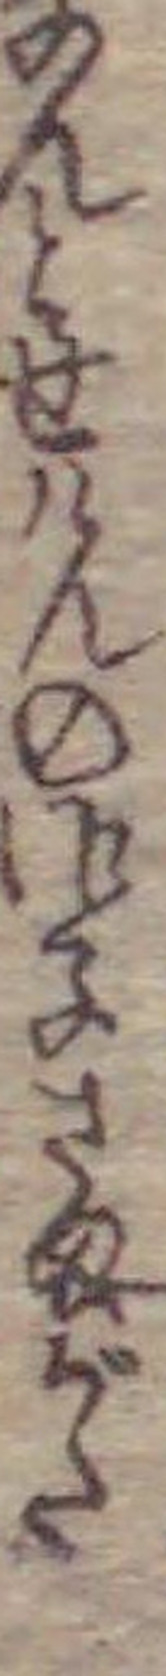なんとせけんの御子さまがた
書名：万物小遣帳 : 2巻
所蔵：国立国会図書館 National Diet Library, JAPAN
